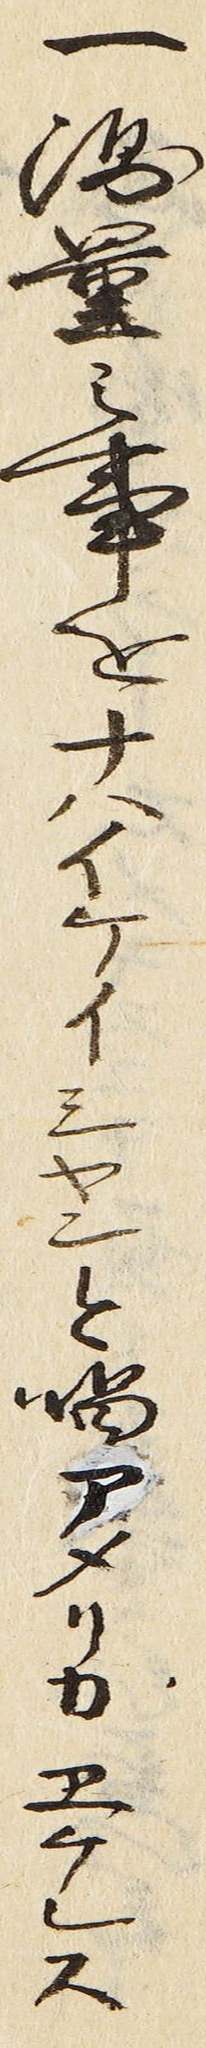一測量之事をナハイケイシヤンと唱アメリカエケレス
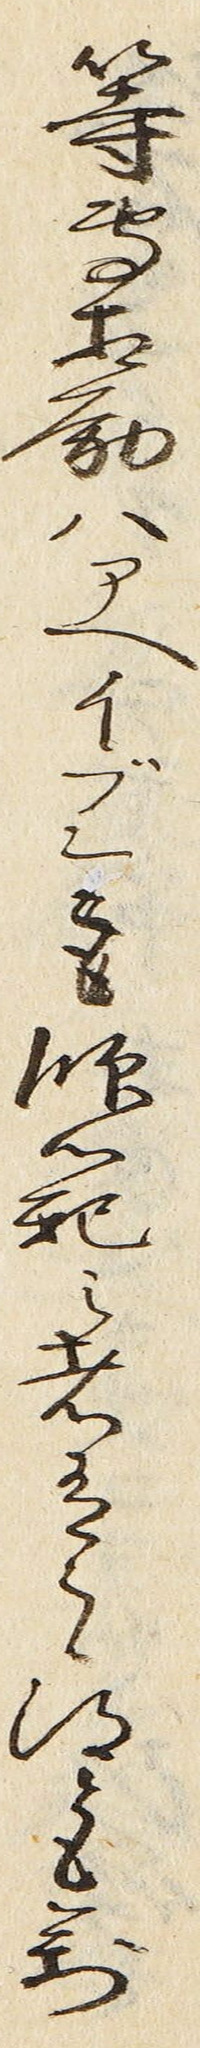等専相励ハアヘイブンにも師範之者有之候得とも万
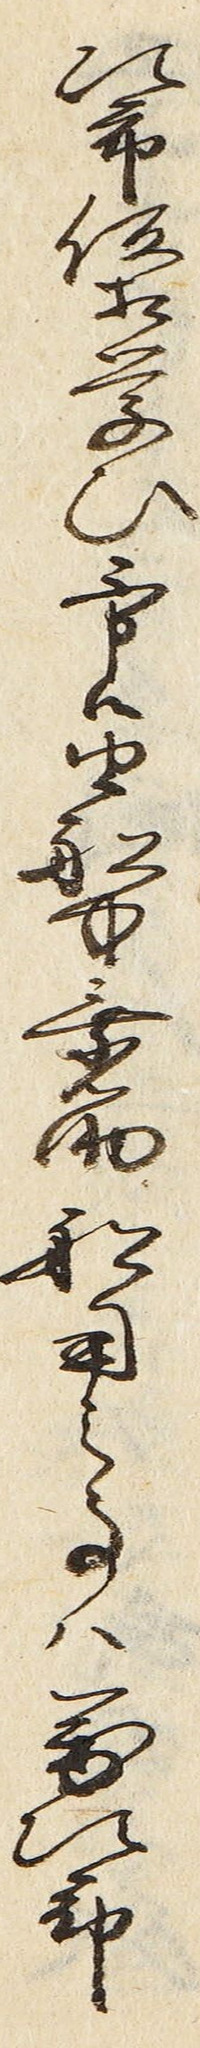次郎仮相学ひ不申候由船中乗筋船用之事は万次郎
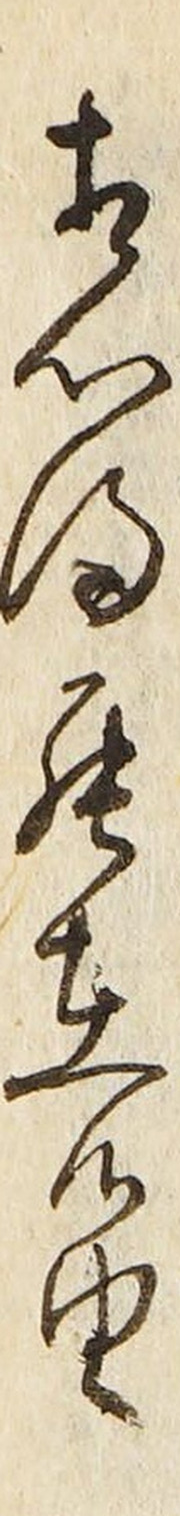相心得罷在候由
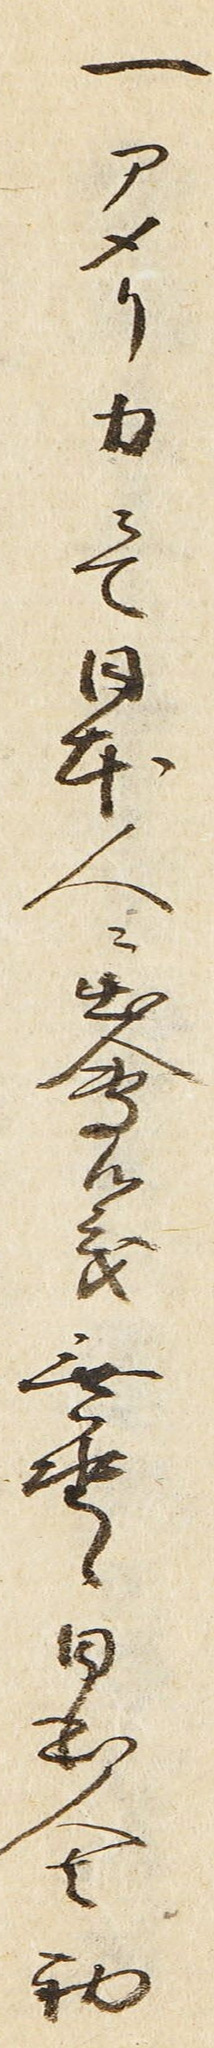一アメリカにて日本人に出会候義無御坐候日本人は初
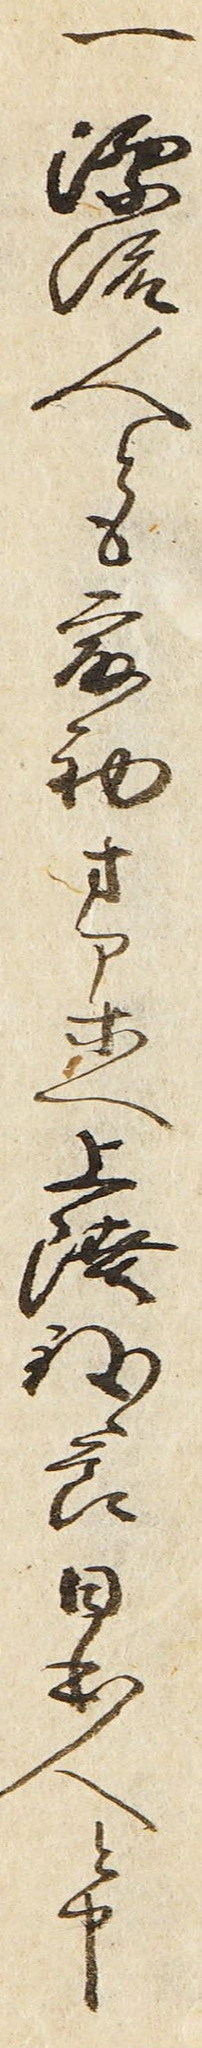一漂流人とも最初オアホへ上陸致候節日本人と申
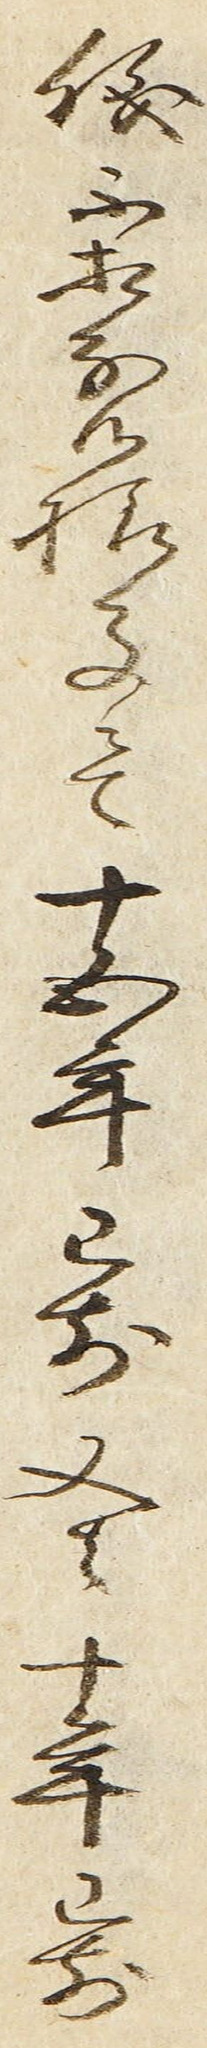儀不相分候様子にて十五年已前又は十年已前
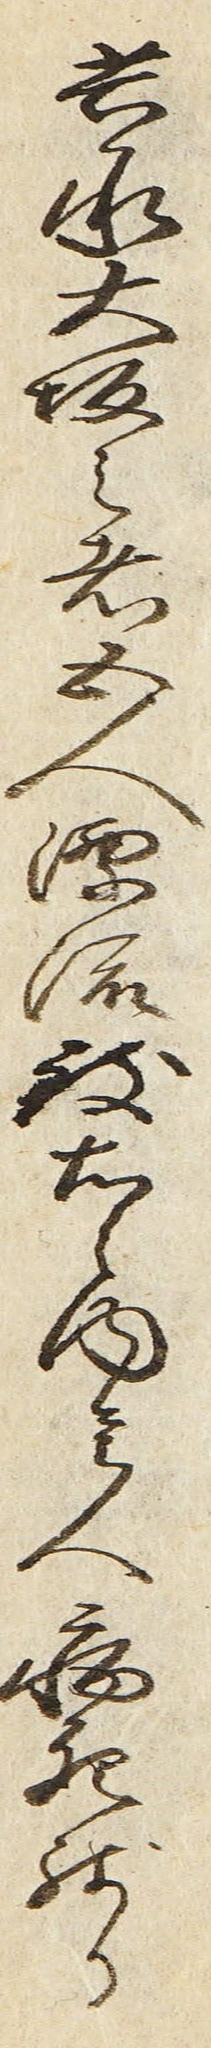共承大坂之者五人漂流致右之内壱人病死残り
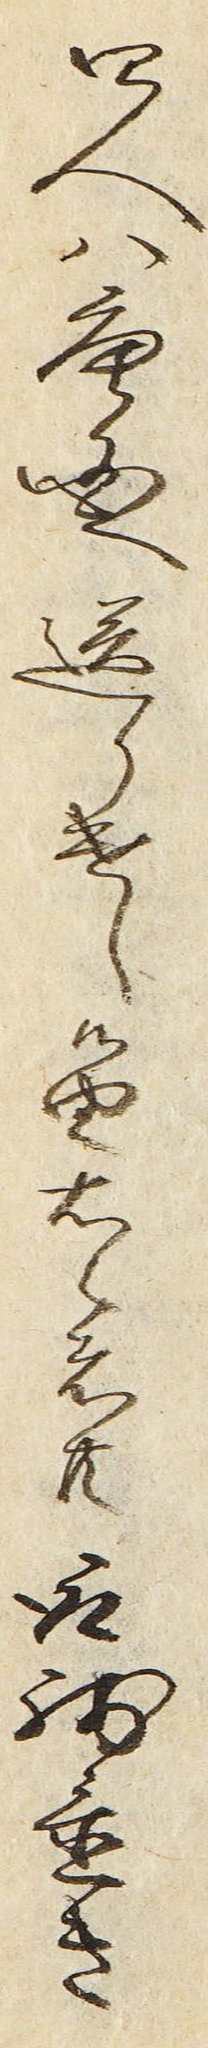四人は唐国へ送り遣し候由右之者共取残置き

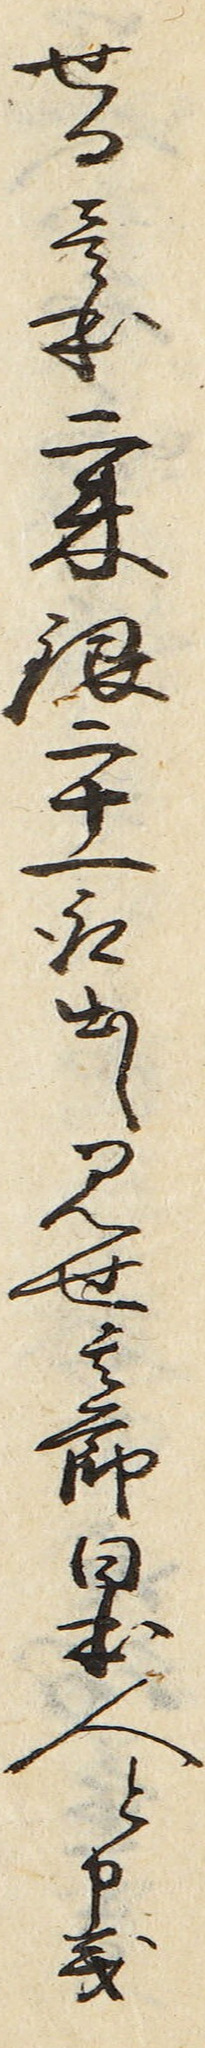せる壱本二朱銀二十一取出し見せ其節日本人と申義
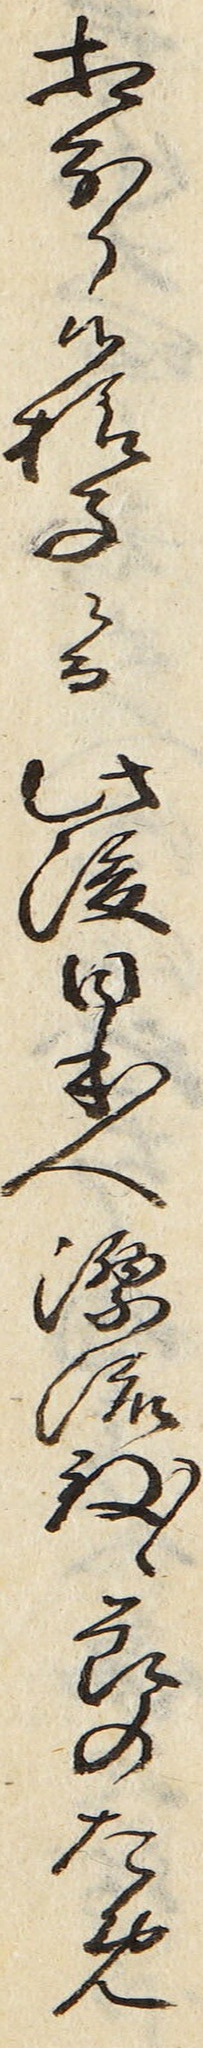相分り候様子に而此後日本人漂流致候節のため
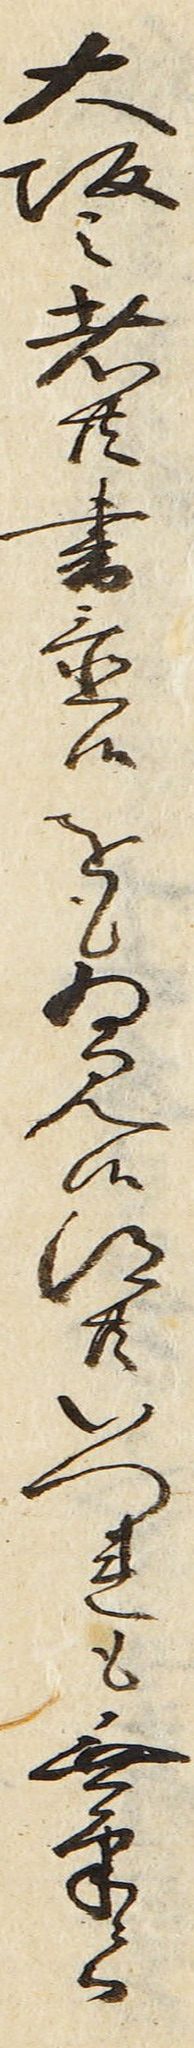大坂之者共書置候をも為見候得共いつれも無筆に而
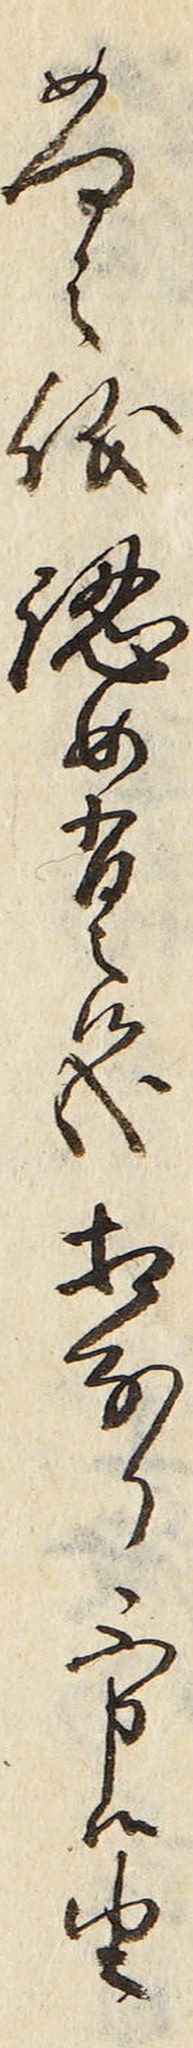如何之儀認め有之候哉相分り不申候由
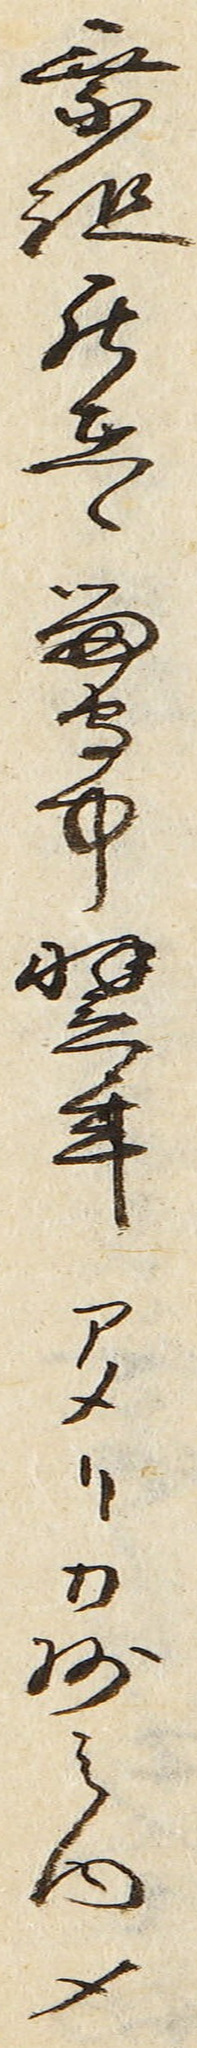乗組罷在候留守中翌年アメリカ州之内メ
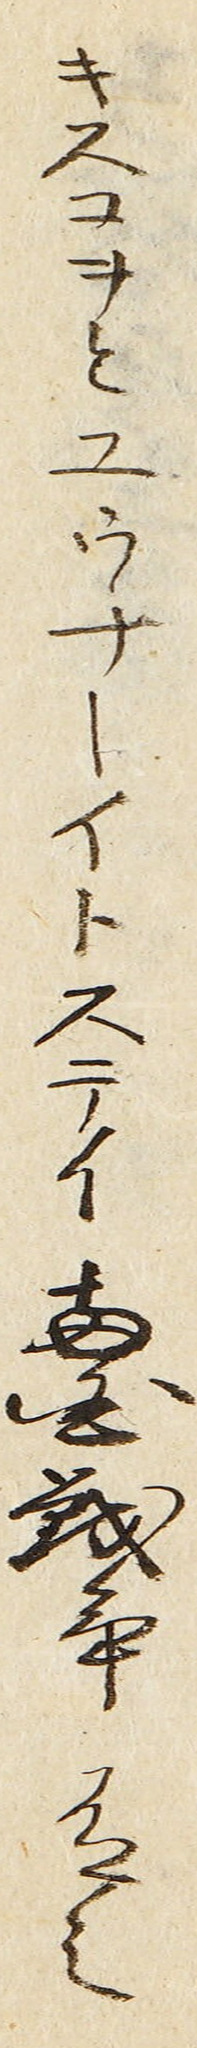キスコヲとユウナーイトステイ両国戦争有之
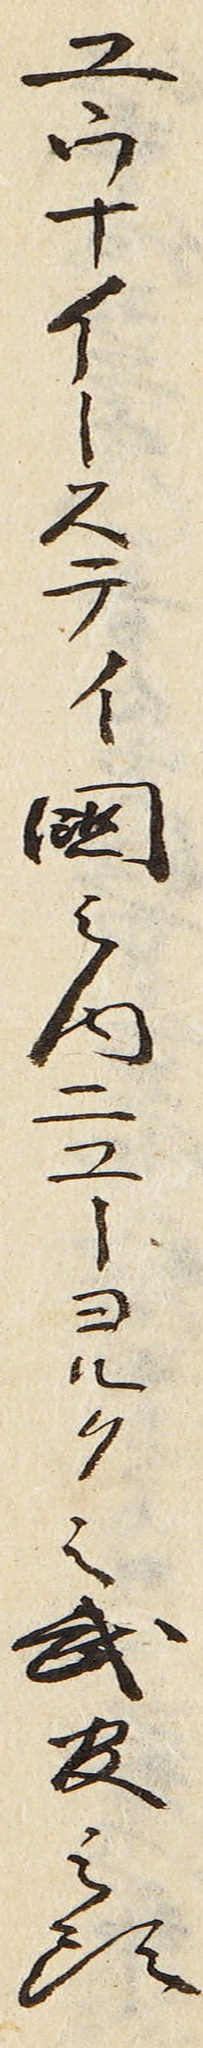ユウナイーステイ国之内ニユーヨルク之武官之頭
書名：土佐中浜万次郎漂流記
